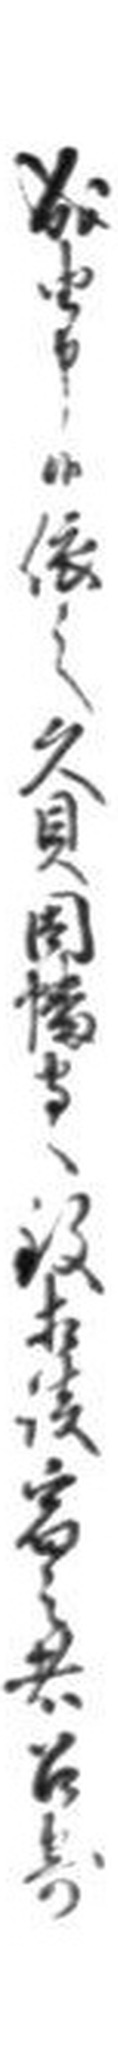成由申候依之久貝因幡守ヘ致相談宿之者召寄
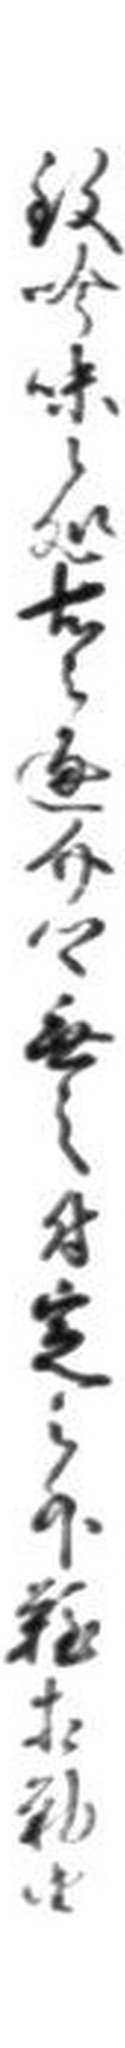致吟味候処右之通介郷無之付定之外難相勤由
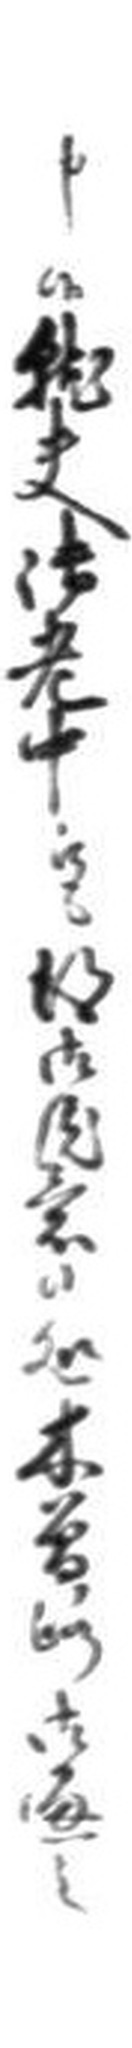申候就夫御老中江も得御内意候処木曽路御通之
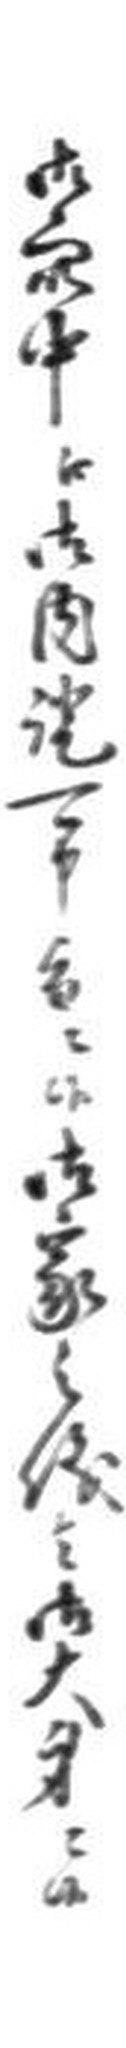御衆中江御内証可申旨ニ候御家之儀者御大身ニ候
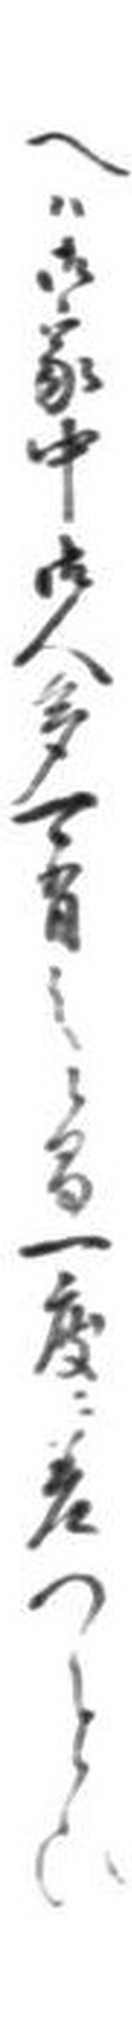へハ御家中御人多可有之候間一度ニ差つとひ
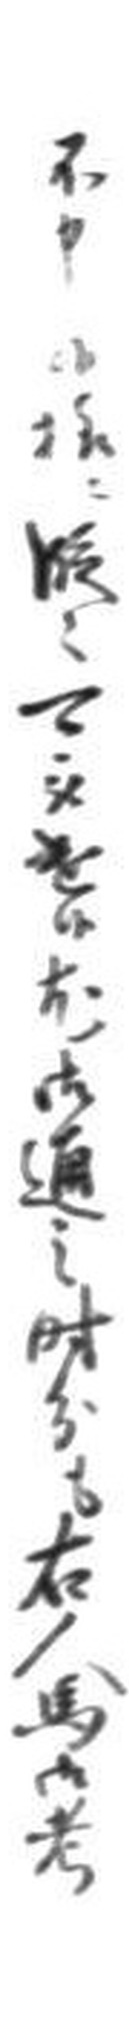不申候様ニ段々可被遣候尤御通之自分も右人馬御考
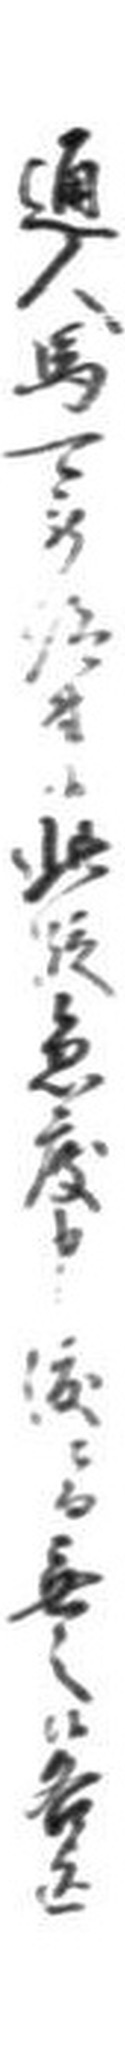通人馬可被仰付候此段急度申渡ニ而無之候各迄
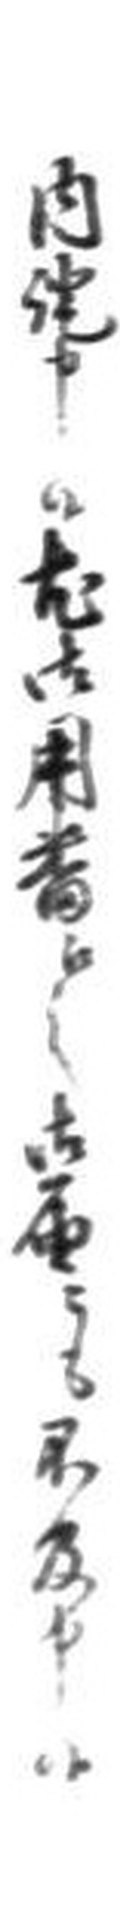内証申候尤御用番江御届ニも不及申候
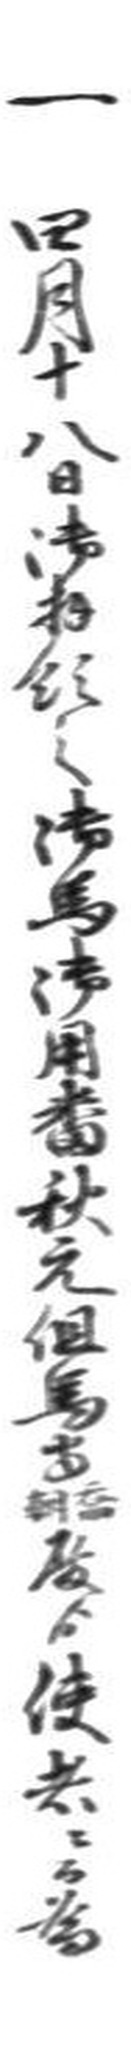一四月十八日御拝領之御馬御用番秋元但馬守喬朝殿ゟ使者ニ而為

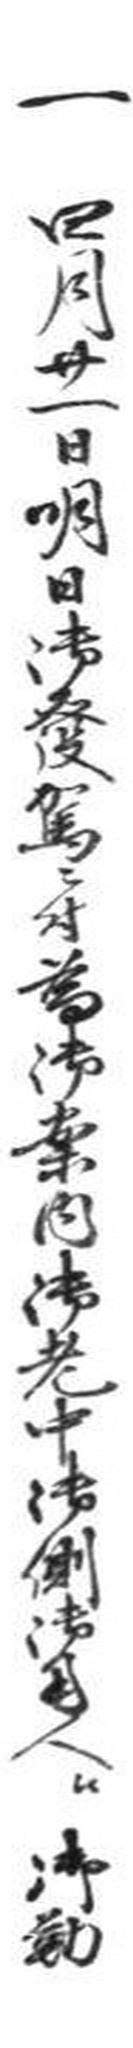一四月廿一日明日御発駕ニ付為御案内御老中御側御用人江御勤
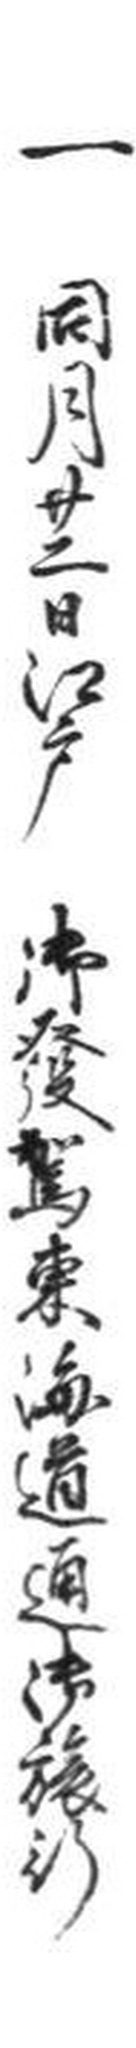一同月廿二日江戸御発駕東海道通御旅行
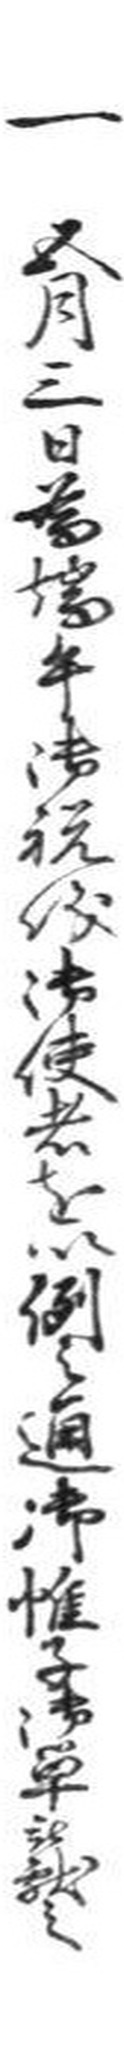一五月三日為端午御祝儀御使者を以例之通御帷子御単被献之
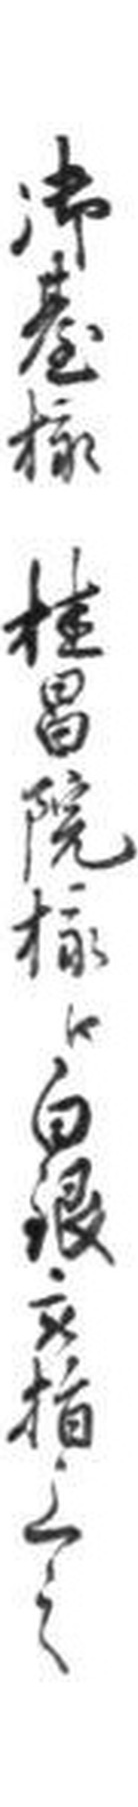御台様桂昌院様江白銀被指上之
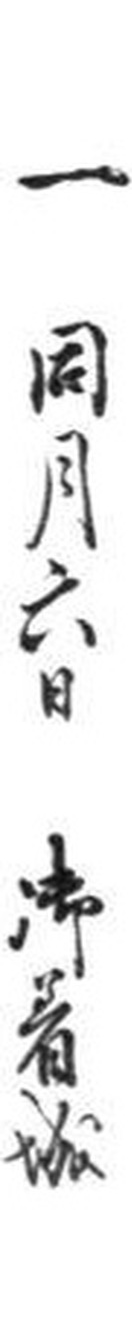一同月六日御着城
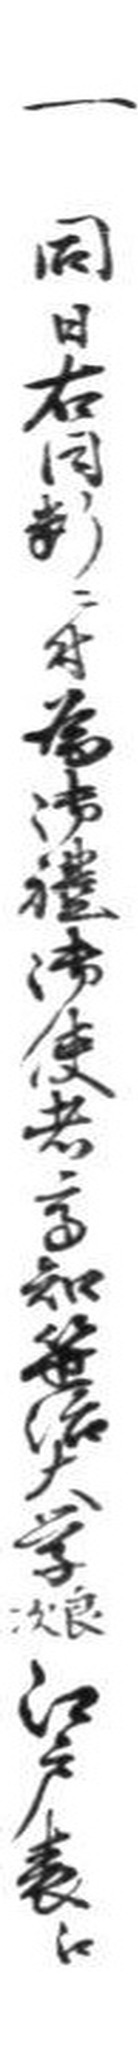一同日右同断ニ付為御礼御使者高知笹治大学良次江戸表江
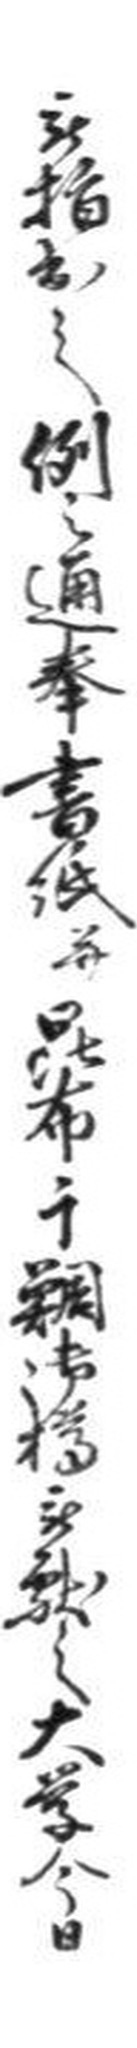被指出之例之通奉書紙并昆布干鯛御樽被献之大学今日
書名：家譜 二十一 吉品公 従元禄十三年到同十四年
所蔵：福井県文書館 Fukui Prefectural Archives
